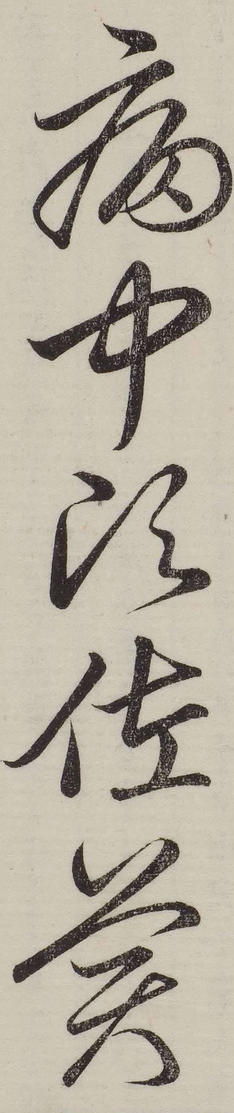病中須佐美

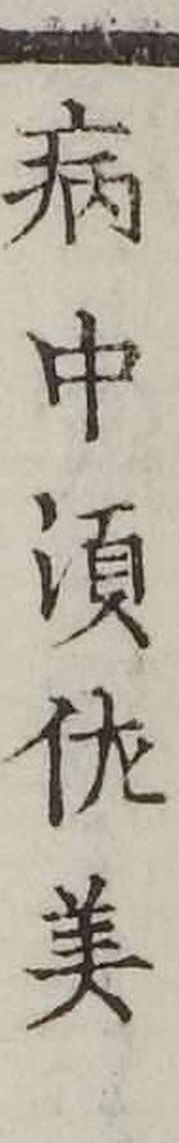病中須佐美
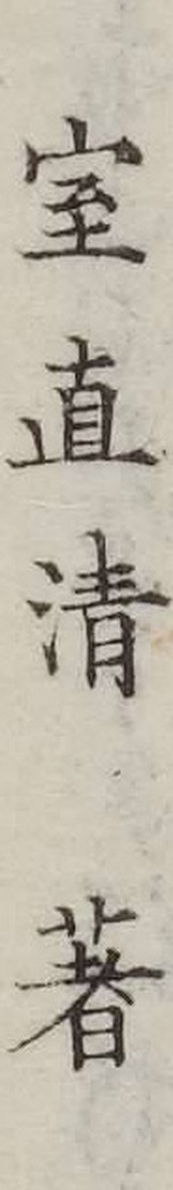室直清著
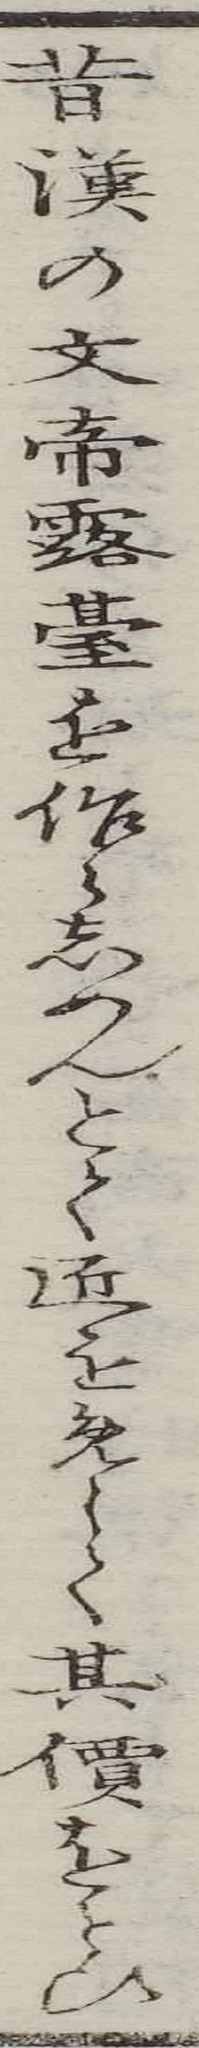昔漢の文帝露臺を作らしめんとて匠をめして其價をとひ
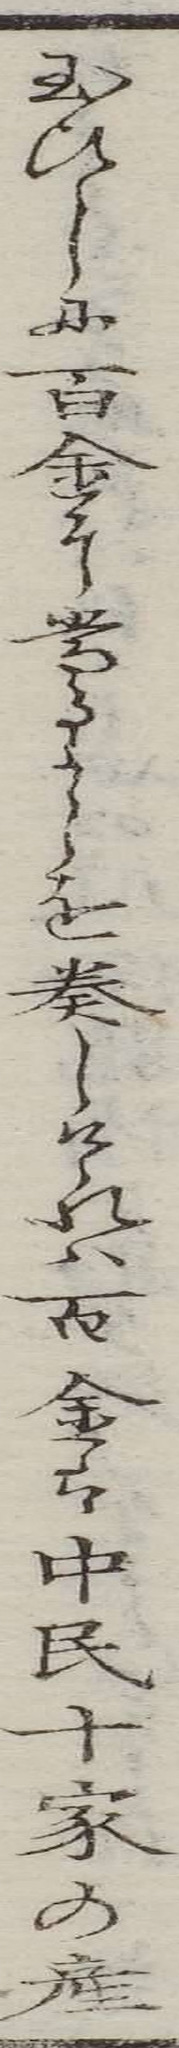玉ひしに百金に當るよしを奏しけれは百金は中民十家の産
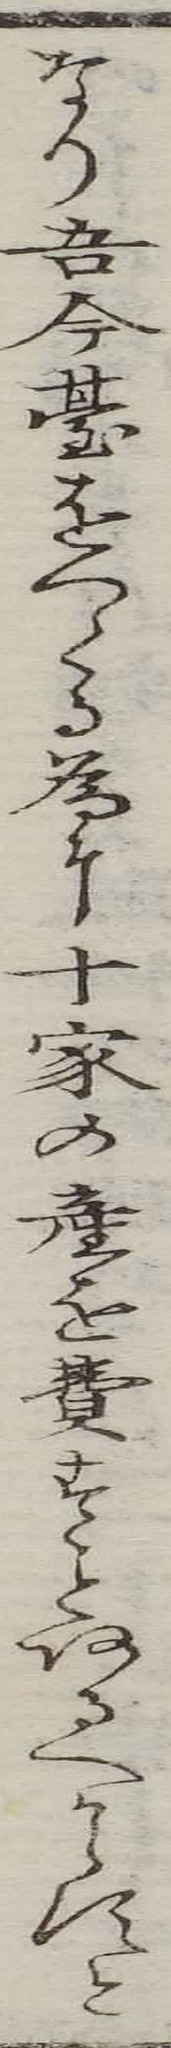なり吾今臺をつくる為に十家の産を費すことあるへからすと
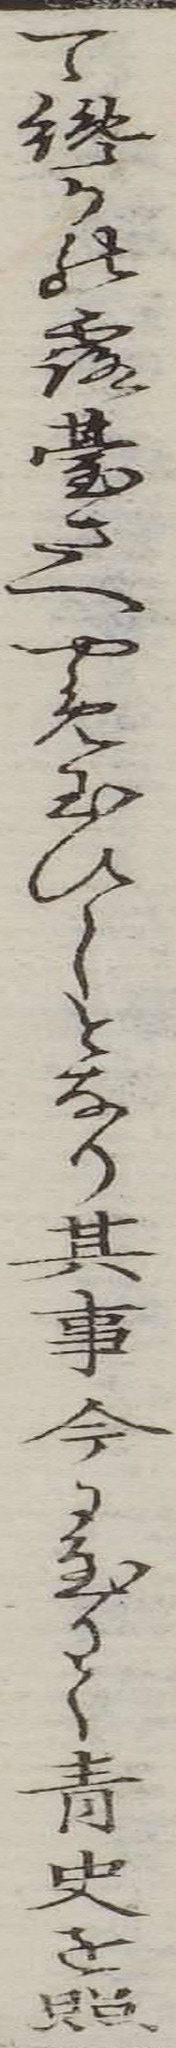て纔かの露臺さへやめ玉ひしとなり其事今に至りて青史を照
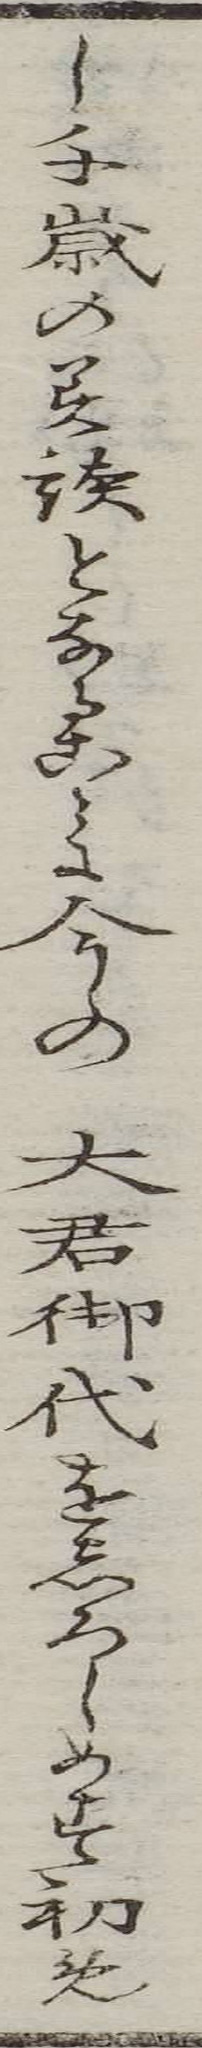し千歳の美談となることに今の大君御代をしろしめす初め
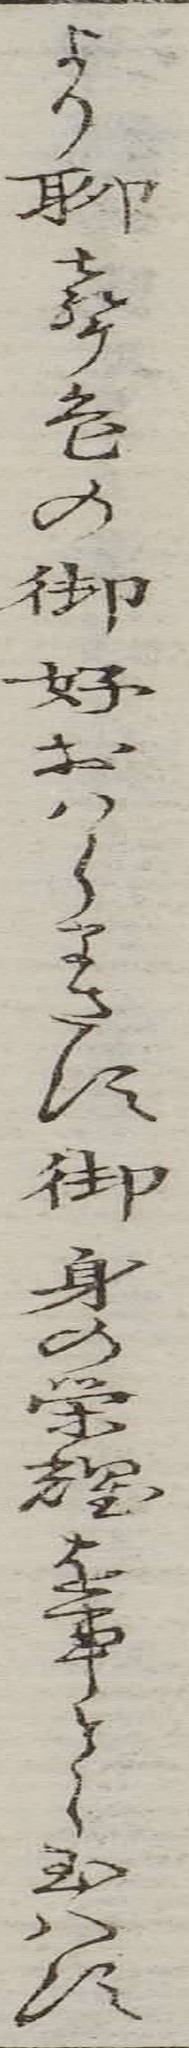より聊声色の御好おはしまさす御身の栄耀を事ことく玉はす
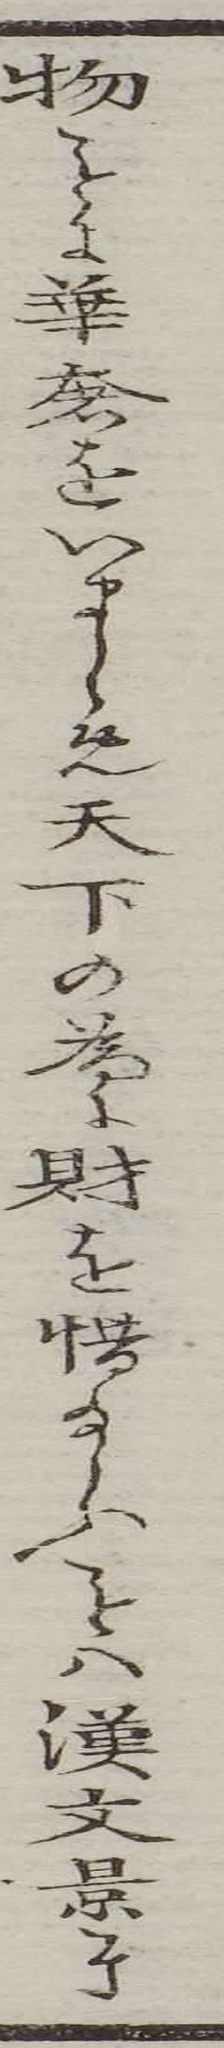物ことに華奢をいましめ天下の為に財を惜給ふことは漢文景に

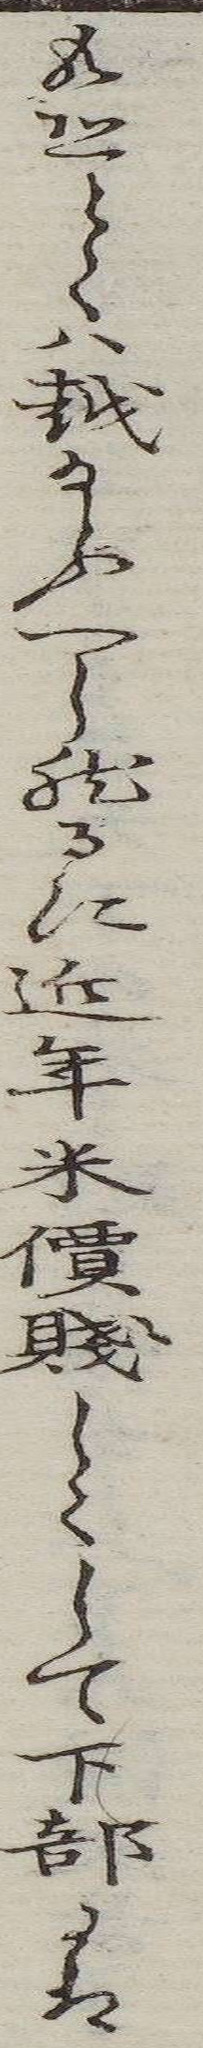も恐しくは越給ふへし然るに近年米價賤しくして下部には
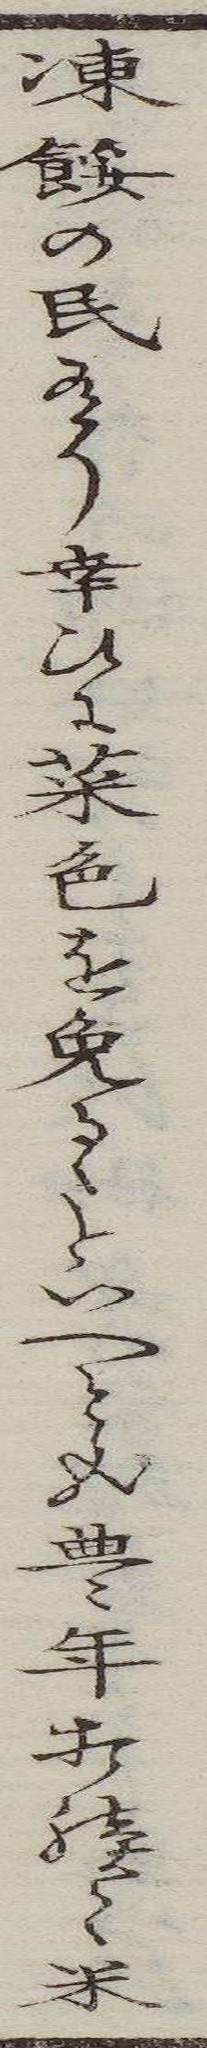凍餒の民有り幸ひに菜色を免るゝといへとも豊年打続て米
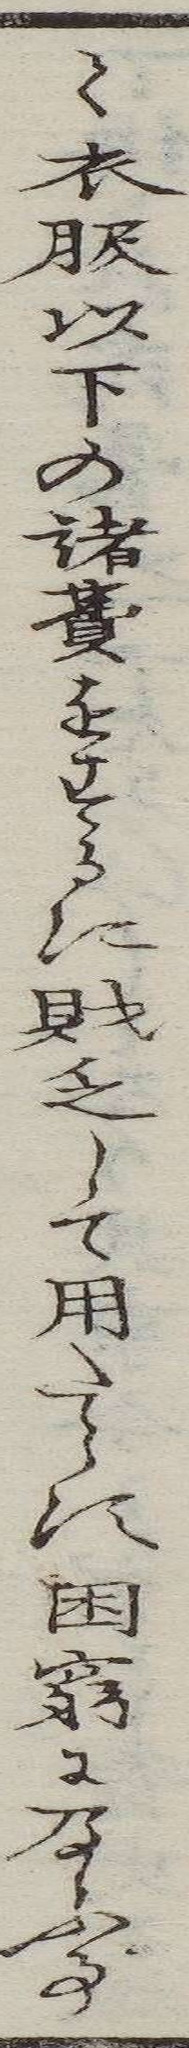て衣服以下の諸費をするに財乏して用たらす困窮に及ふ事
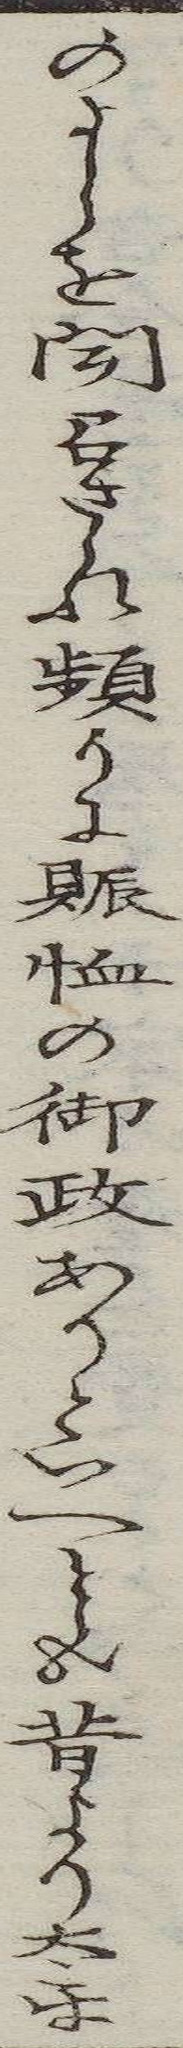のよしを聞召され頻りに賑恤の御政ありといへとも昔より太平
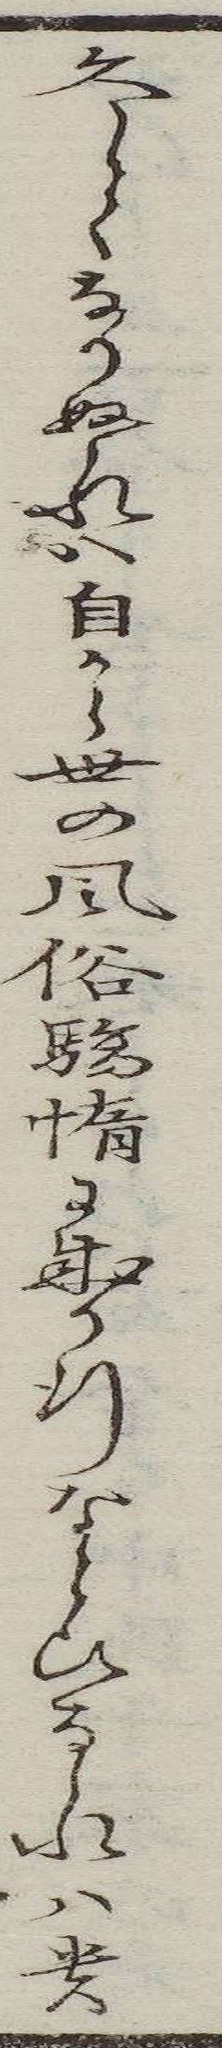久しくなりぬれは自から世の風俗驕惰に成り行ならいなれは貴
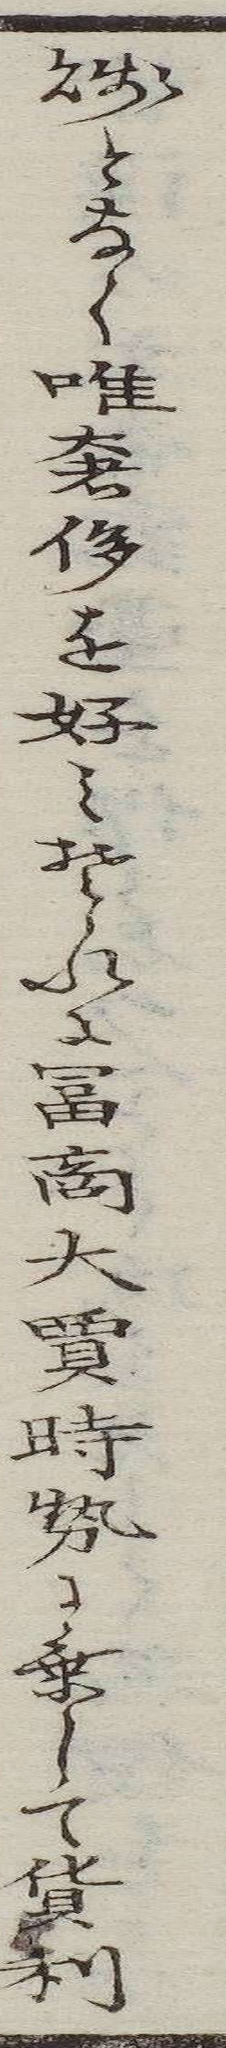賤となく唯奢侈を好みそれに冨商大賈時勢に乗して貨利
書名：病中須佐美
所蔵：国文学研究資料館
